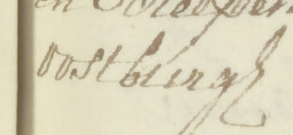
oostburgh
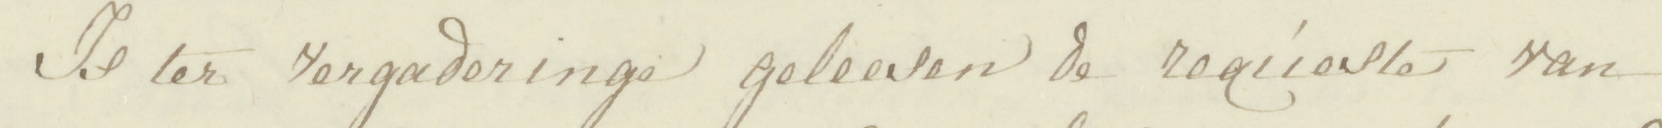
Is ter vergaderinge geleesen de requeste van
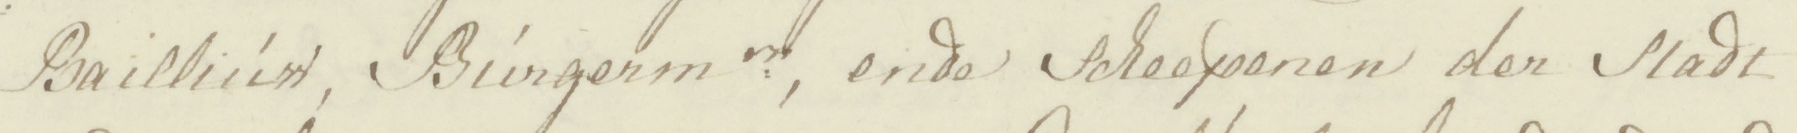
Bailluw, Burgermn., ende scheepenen der Stadt
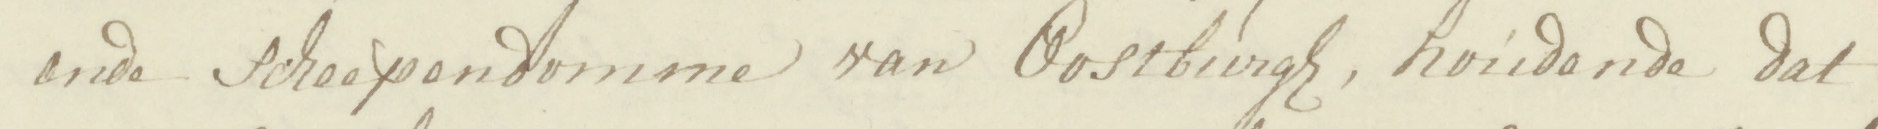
ende scheependomme van Oostburgh, houdende dat
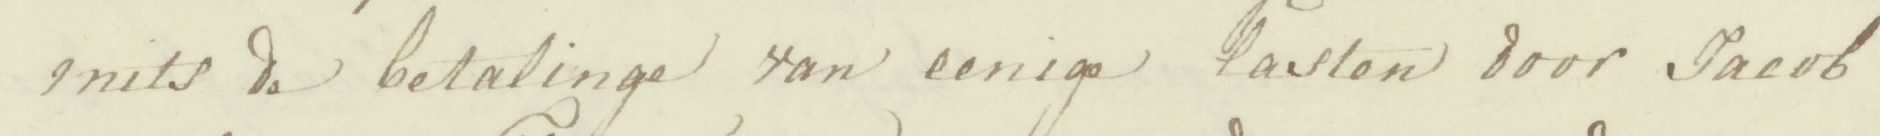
mits de betalinge van eenige lasten door Jacob
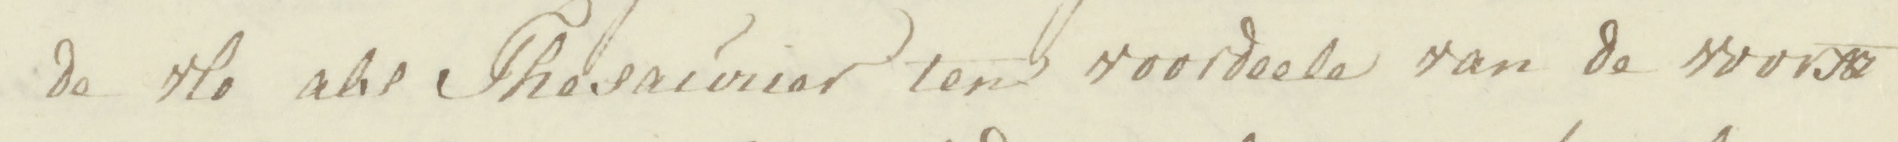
de vlo als Thesaurier ten voordeele van de voorsz
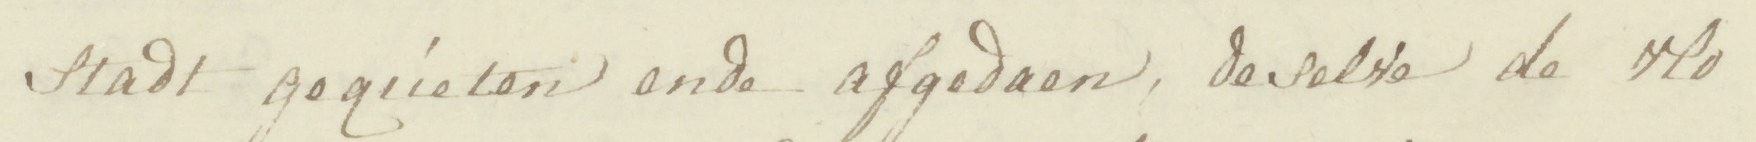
stadt gequeten ende afgedaen, deselve de vlo
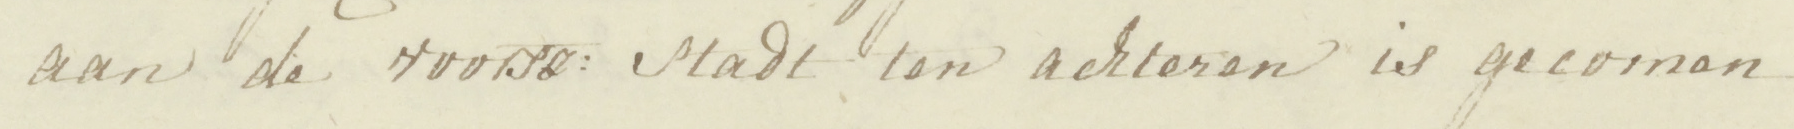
aan de voorsz: stadt ten achteren is gecomen
